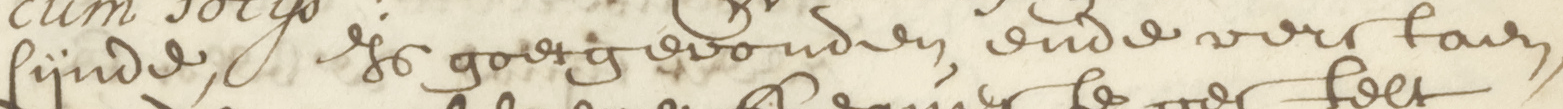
sijnde, Is goetgevonden ende verstaen,
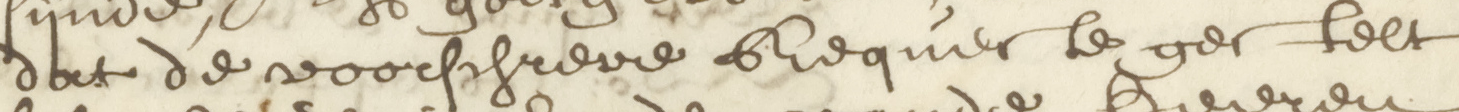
dat de voorschreve Requeste gestelt
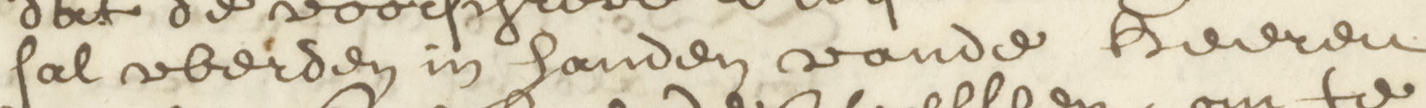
sal werden in handen vande Heeren
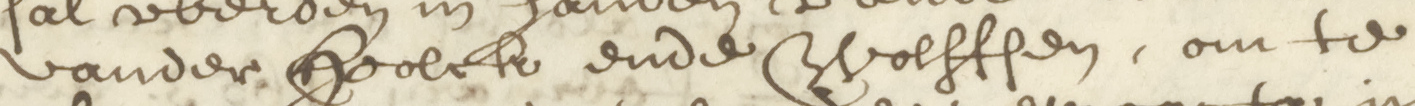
vander Hoolck ende Wolffsen, om te
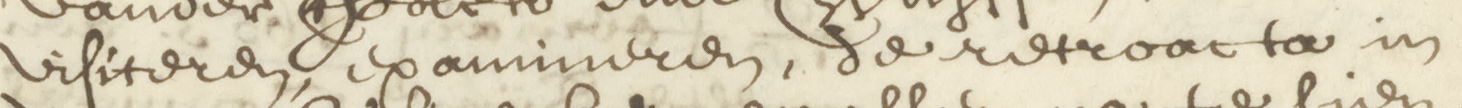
visiteren, examineren, de retroacta in
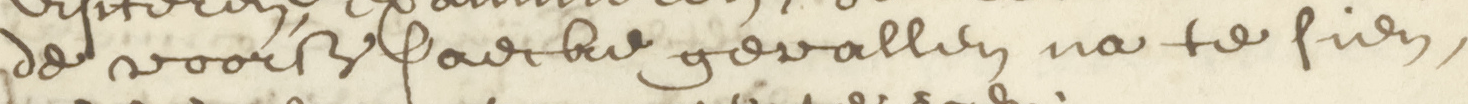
de voorss. saecke gevallen na te sien,
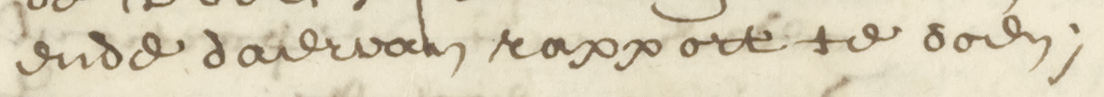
ende daervan rapport te doen;
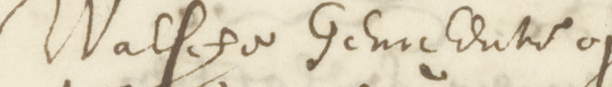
Walsche Gemeente op
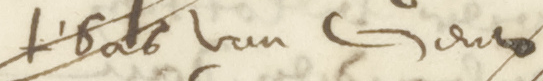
t‛ sas van Gent
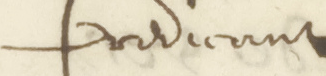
Predicant
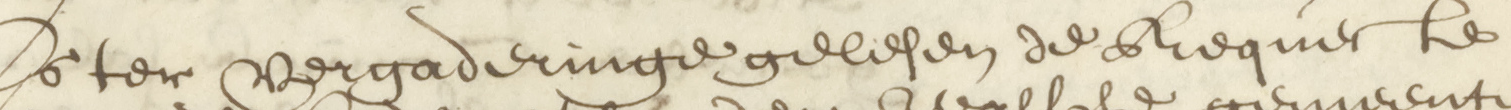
Is ter Vergaderinge gelesen de Requeste
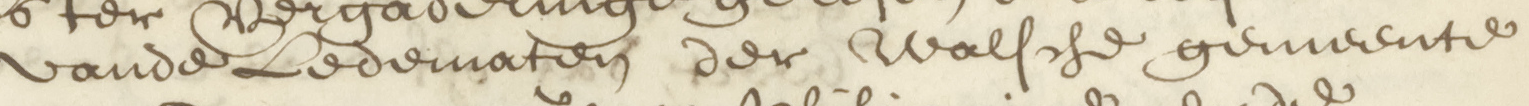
vande Ledematen der Walsche gemeente
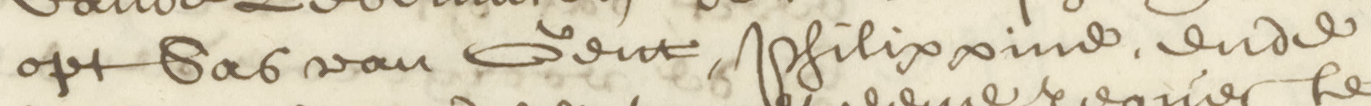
opt Sas van Gent, Philippine, ende
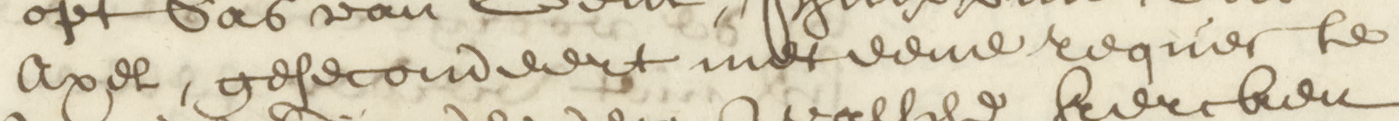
Axel, gesecondeert met eene requeste
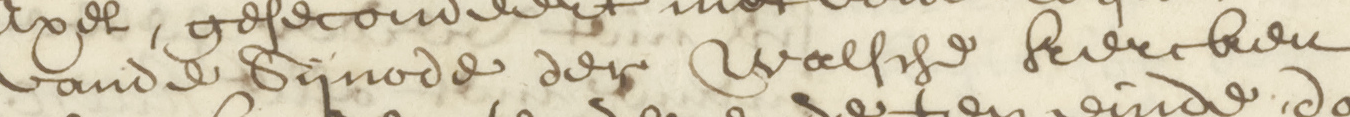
vande Sijnode der Walsche kercken
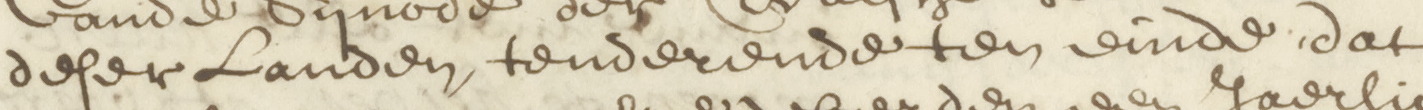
deser Landen, tenderende ten einde dat
